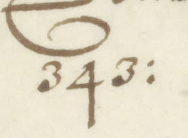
343:
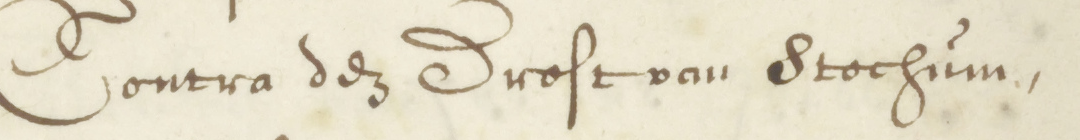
Contra den Drost van Stochum,
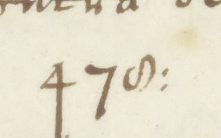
478:
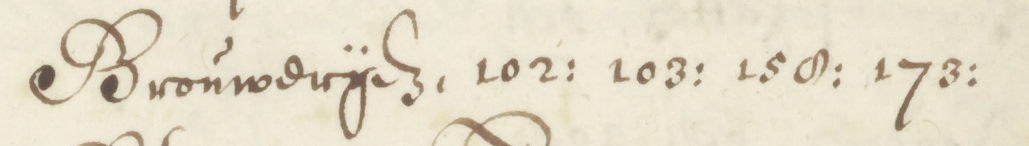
Brouwerijen, 102: 103: 158: 173:
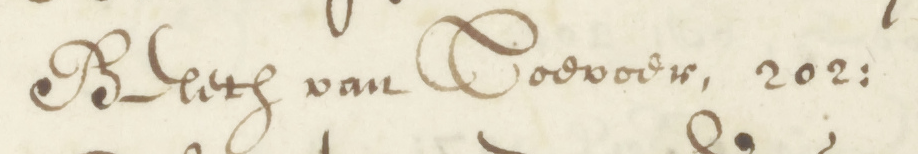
Beleth van Toevoer, 202:
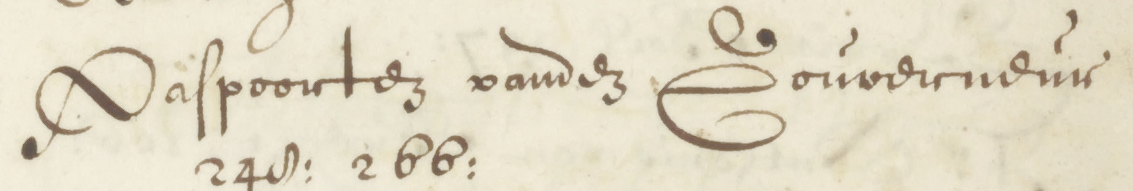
Paspoorten vanden Gouverneur
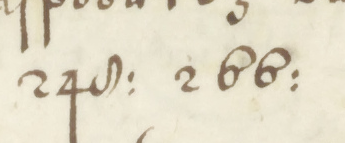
248: 266:
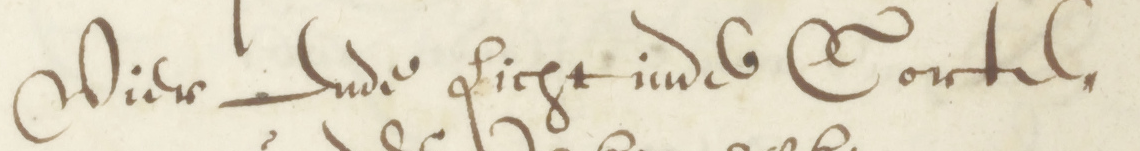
Vier Ende licht inde Corte„
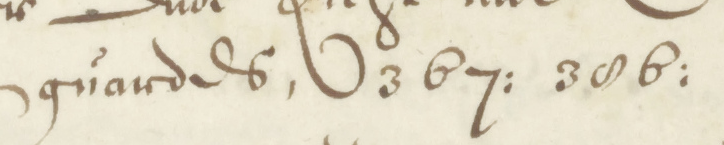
guardes, 367: 386:
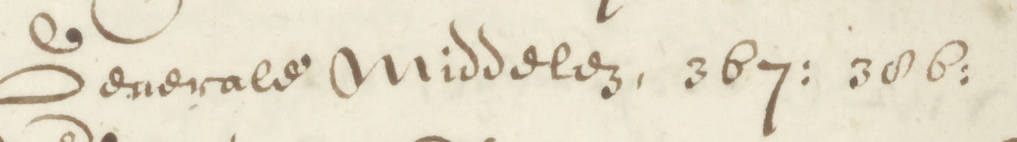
Generale Middelen, 367: 386:
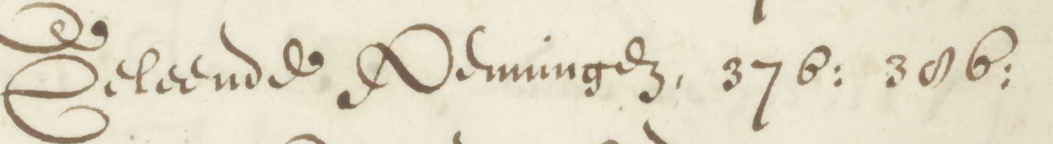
Geleende Penningen, 376: 386:
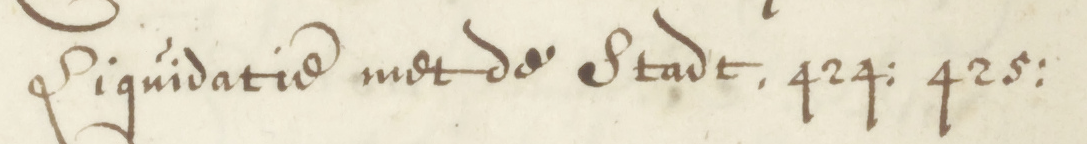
Liquidatie met de Stadt, 424: 425:
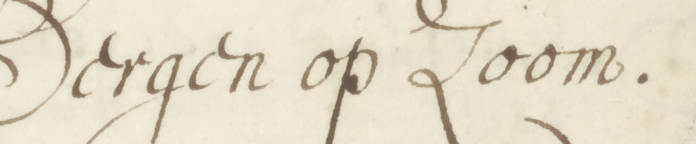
Bergen op Zoom.
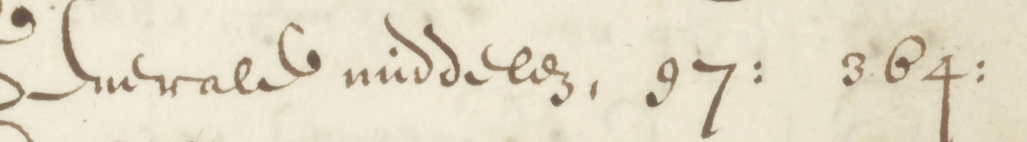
Generale middelen, 97: 364:
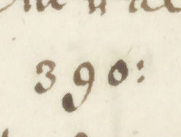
390:
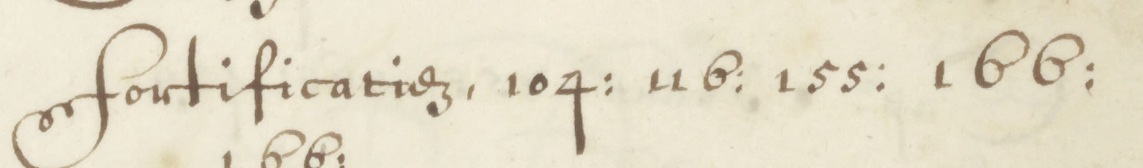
Fortificatien, 104; 116: 155: 166:
